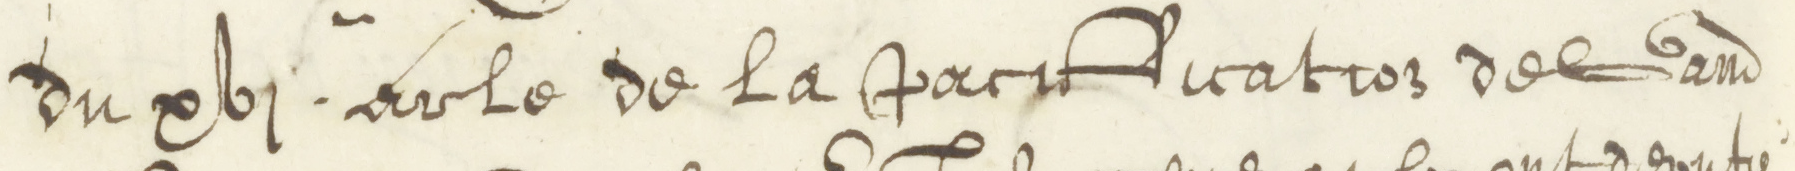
du xvie arle de la paciffication de Gand
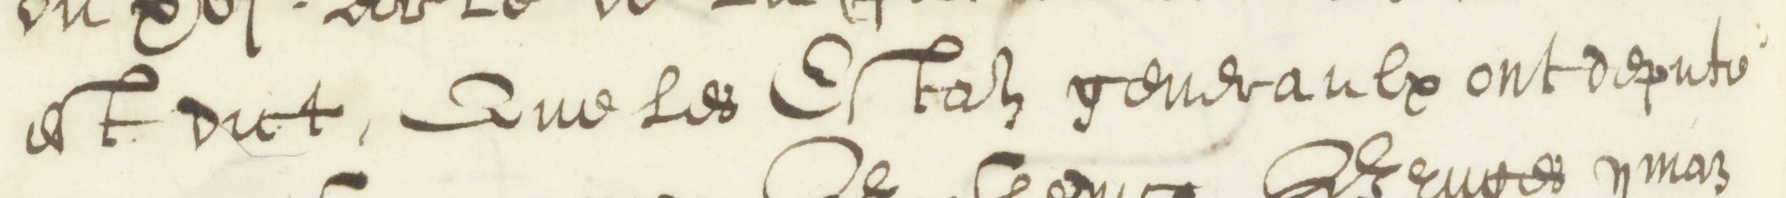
est dict, Que les Estatz generaulx ont deputé
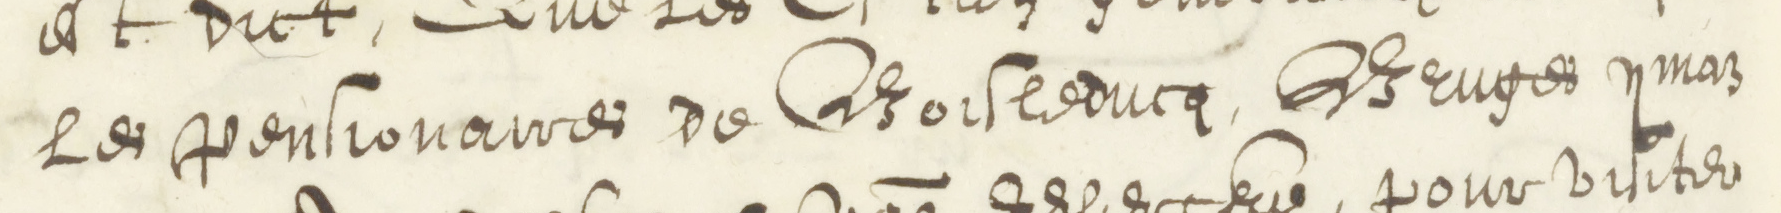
les pensionaires de Boisleducq, Bruges Yman
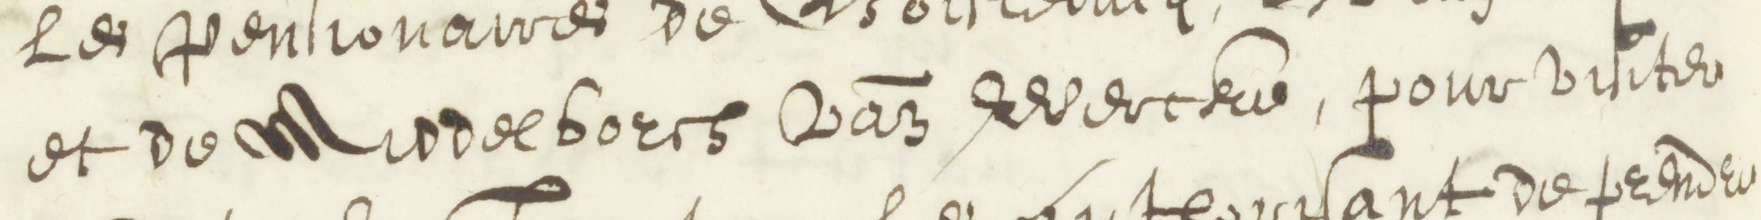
et de Middelborch van Wercke, pour visiter
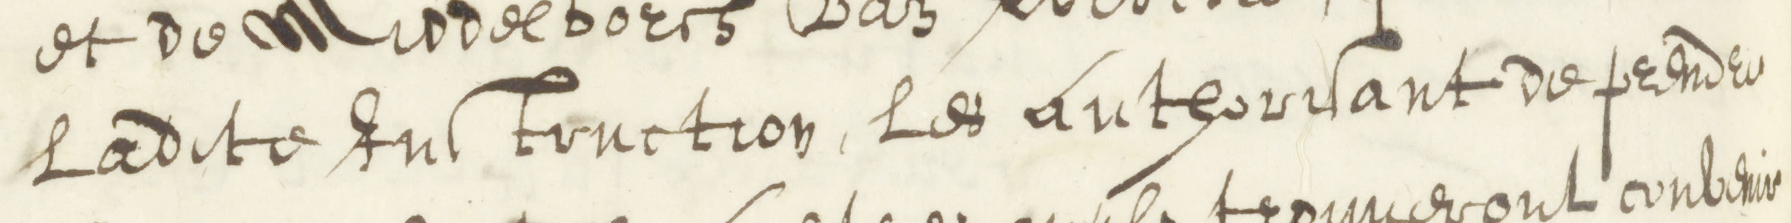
ladite Instruction, les authorisant de prendre
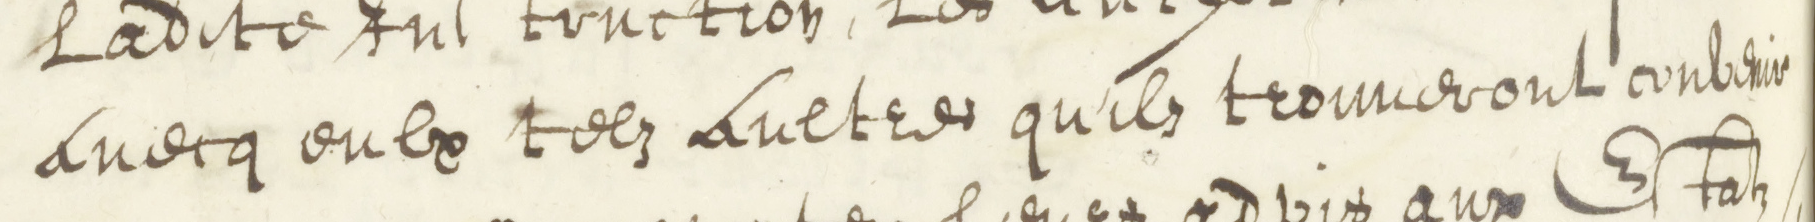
auecq eulx telz aultres qu‛ilz trouueront convenu
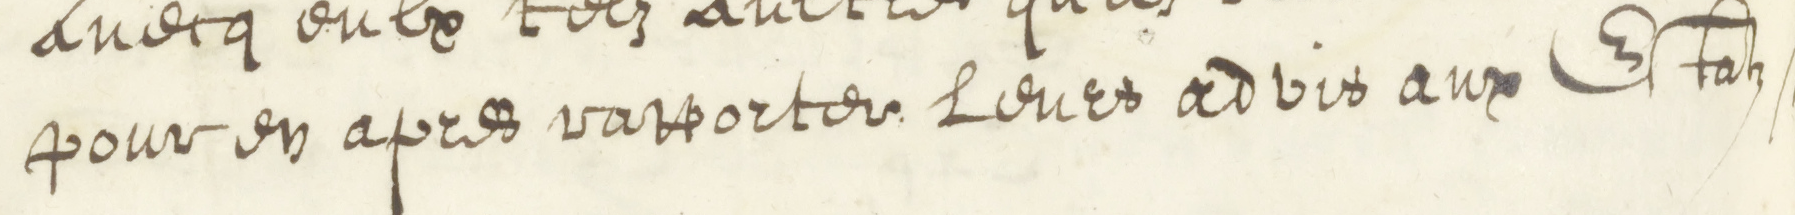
pour en apres rapporter leurs advis aux Estatz.
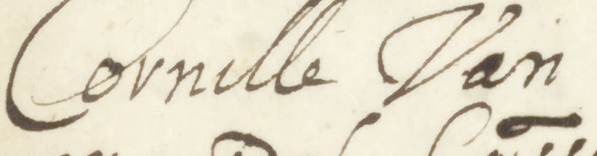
Cornille Van
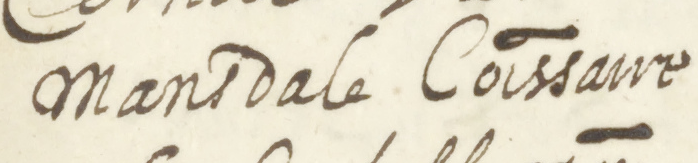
Mansdale Coissaire
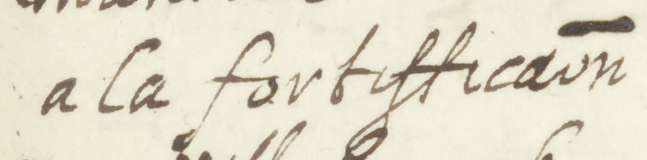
a la fortifficaon
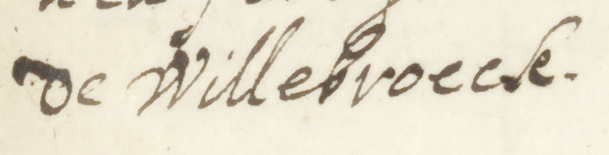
de Willebroeck.
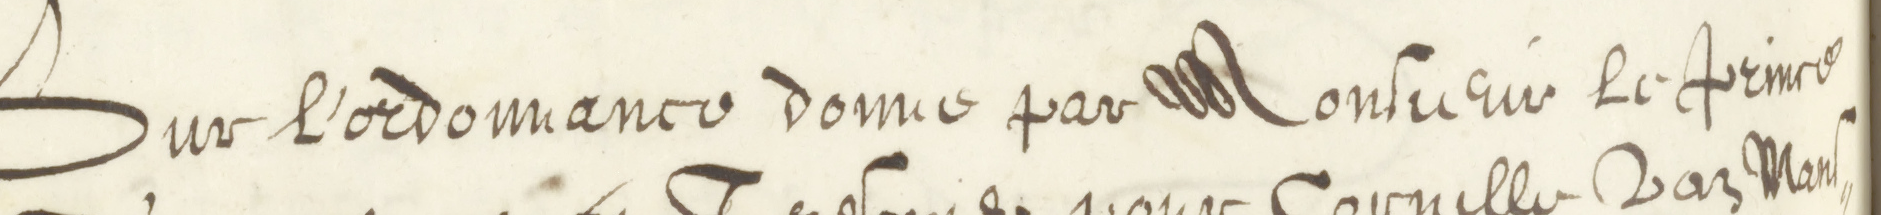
Sur l‛odonnance donne par Monsieur le Prince
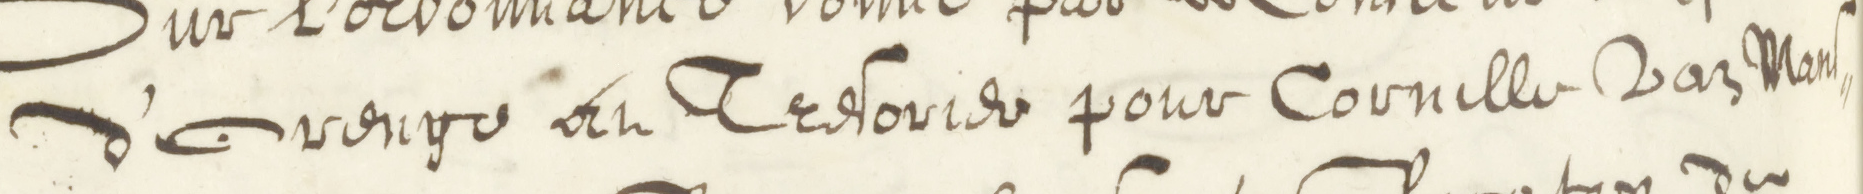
d‛Orenge au Tresorier pour Cornille van Mans„
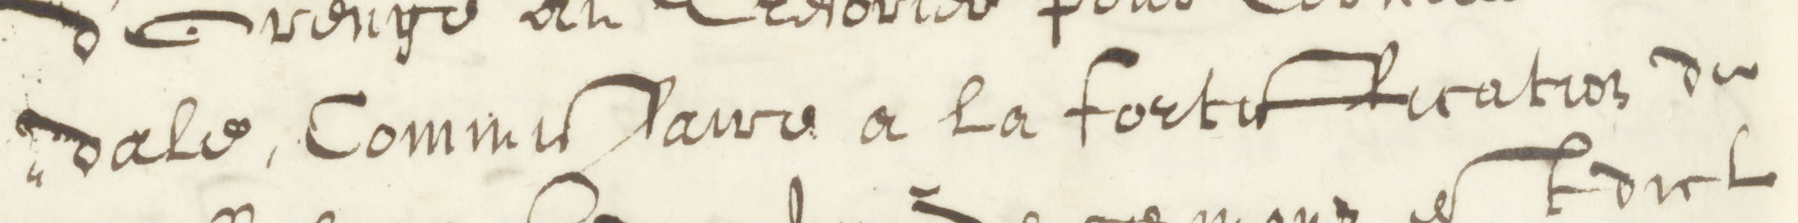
„dale, Commissaire a la fortiffication de
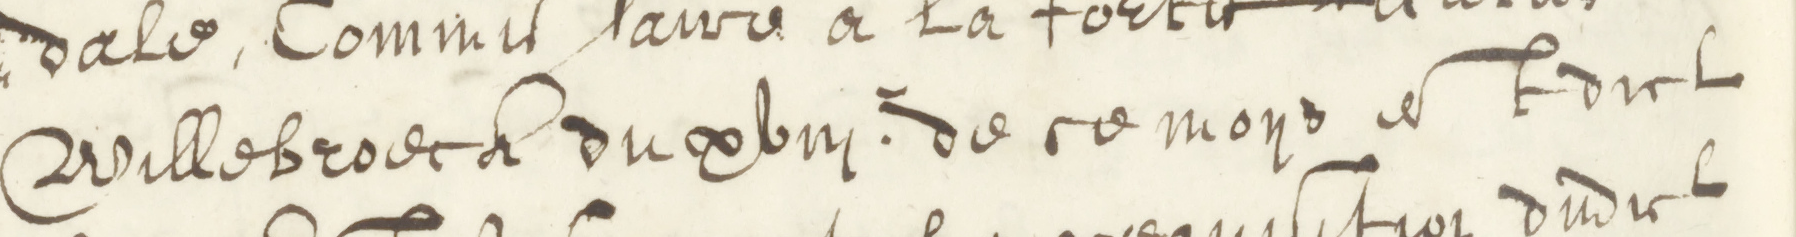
Willebroeck du xviije. de ce moys est dict
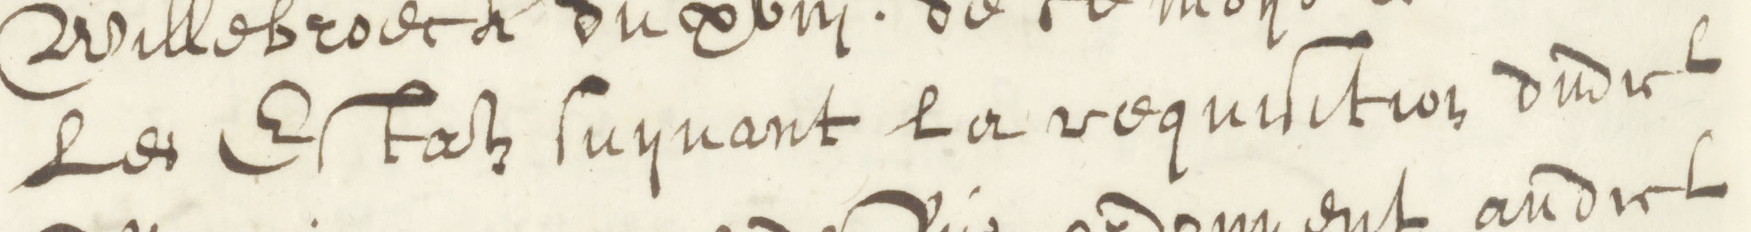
les Estatz suyuant la requisition dudict
